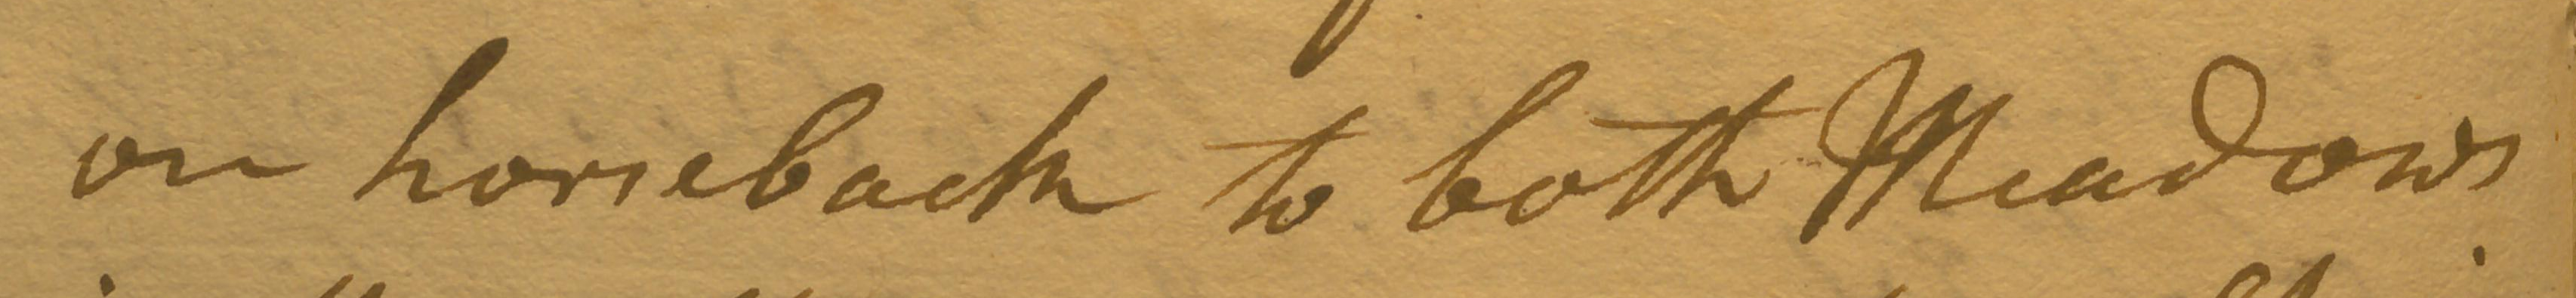on horseback to both Meadows
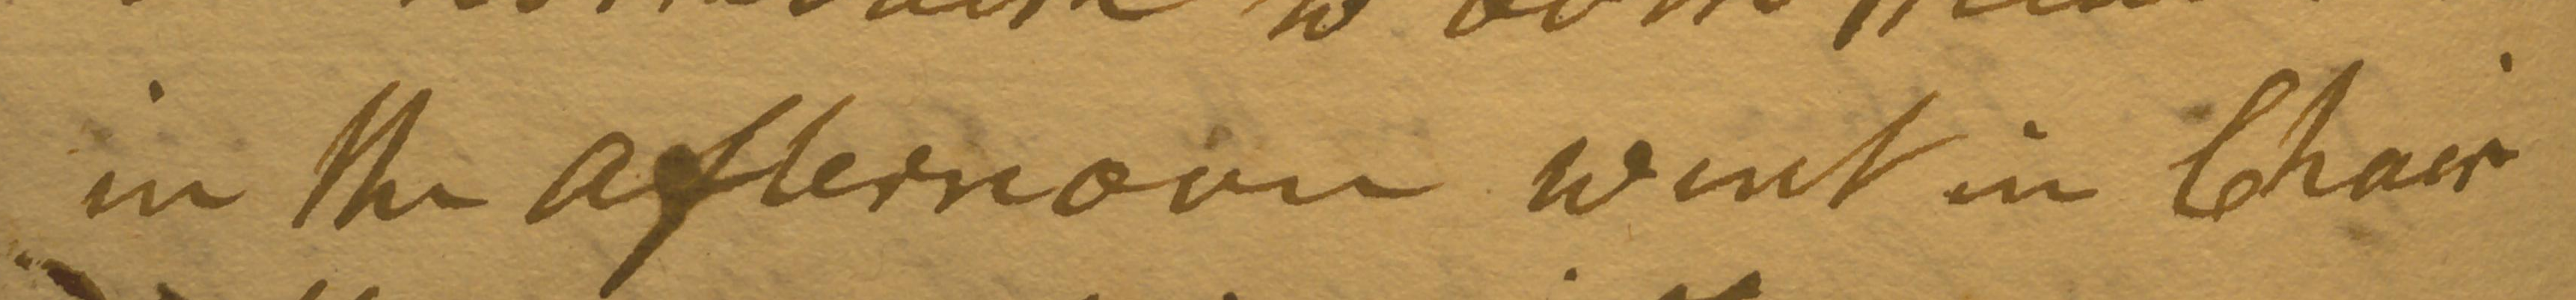in the afternoon went in Chair
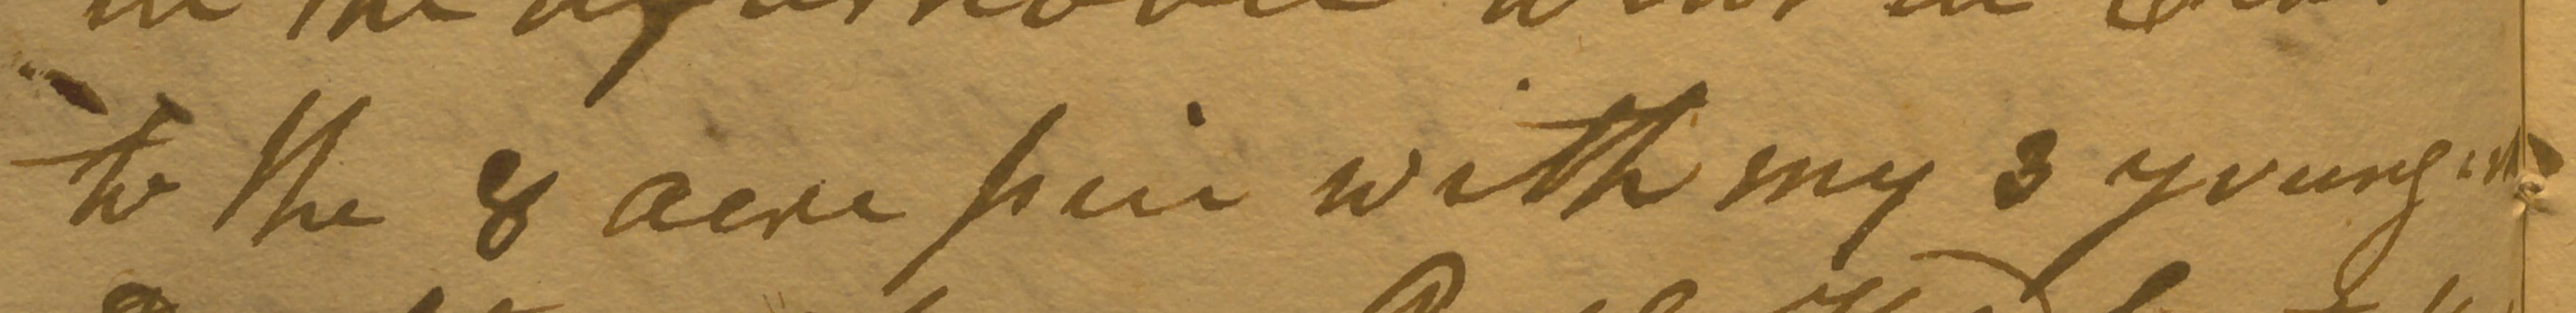to the 8 acre pice with my 3 youngest
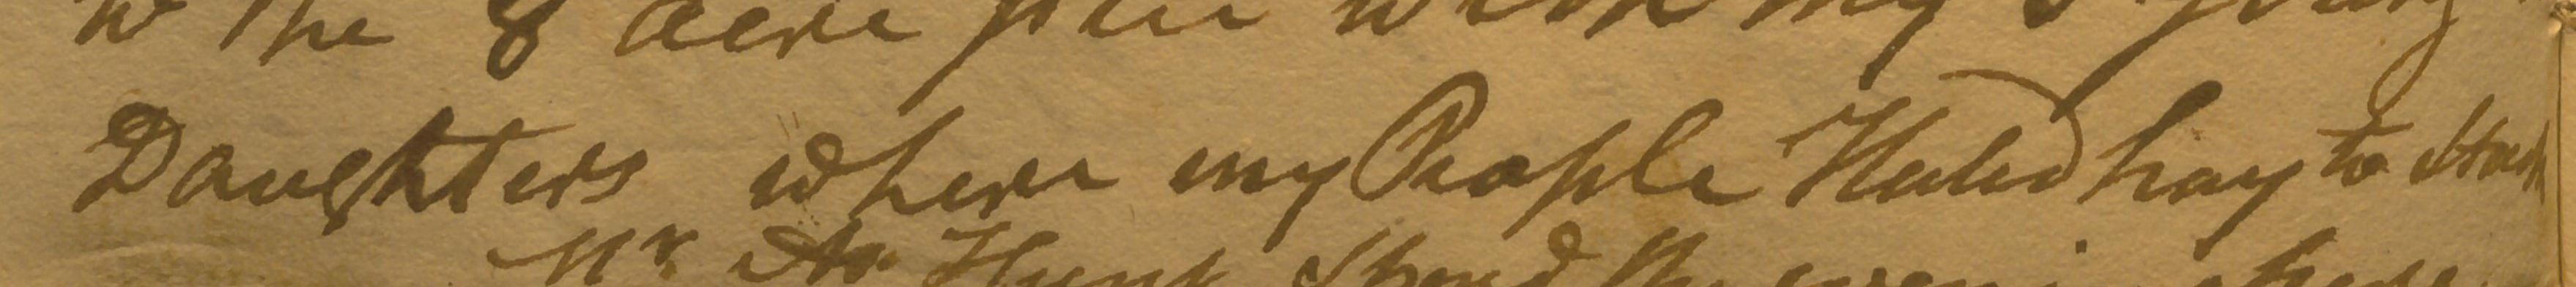Daughters where my Peaple Haled hay to stable
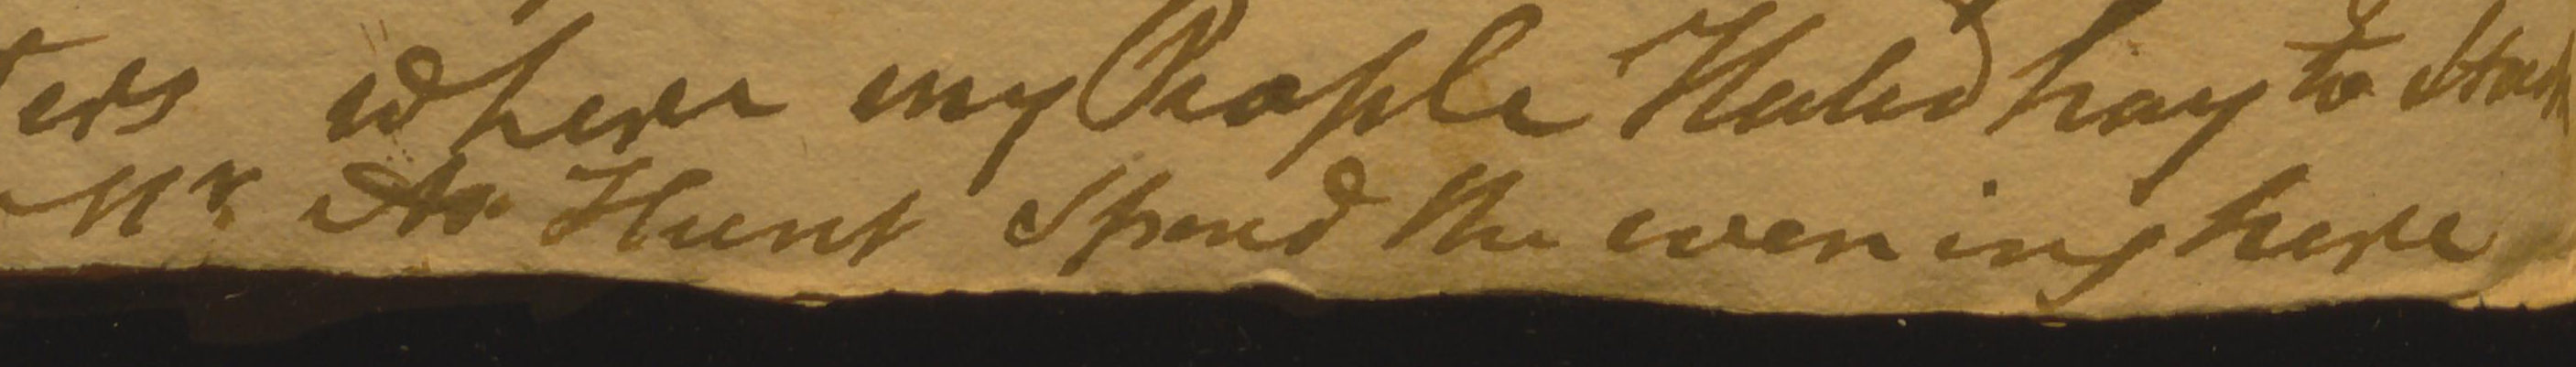M^r. A Hunt spend the evening here
